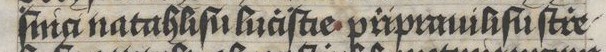ẛnici natahliſu luċiẛtie.pṙipraviliſu ſtṙe¬
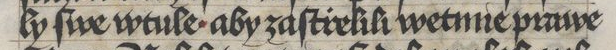ly ſwe wtule.aby zaſtṙelili wetmie prawe
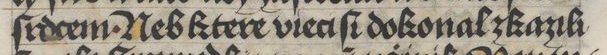ſrdcem.Neb ktere vieci ſi dokonal zkazili
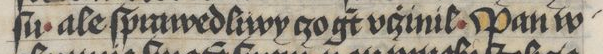ſu.ale ſprawedliwy czo ḡt ucžinil.Pan w¬
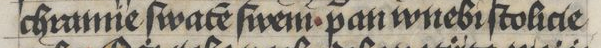chramie ſwatē ſwem.pan w nebi ſtolicie
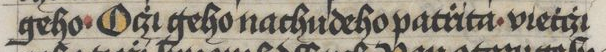geho.Ocżi geho nachudeho patṙita.vietcżi
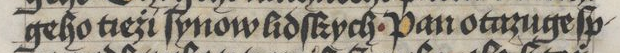geho tieżi ſynow lidſkych.Pan otazuge ſp¬
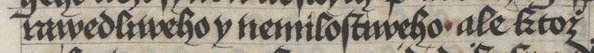rawedliweho y nemiloſtiweho.ale ktoż
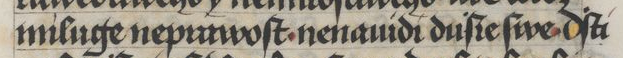miluge neprawoſt.nenavidi duẛie ſwe.Dẛtí
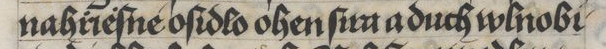nahřieẛné oſidlo ohen ſira a duch wlnobi¬
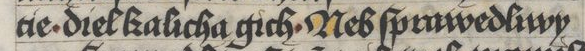tie.diel kalicha gich.Neb ſprawedliwy
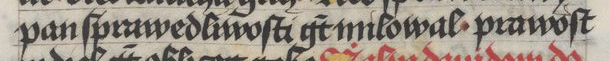pan ſprawedliwoſti ḡt milowal.prawoſt
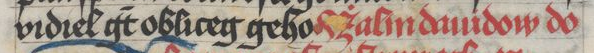vidiel ḡt obliceg geho Żalm davidow do
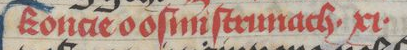koncie o oſmi ſtrunach.xi.
